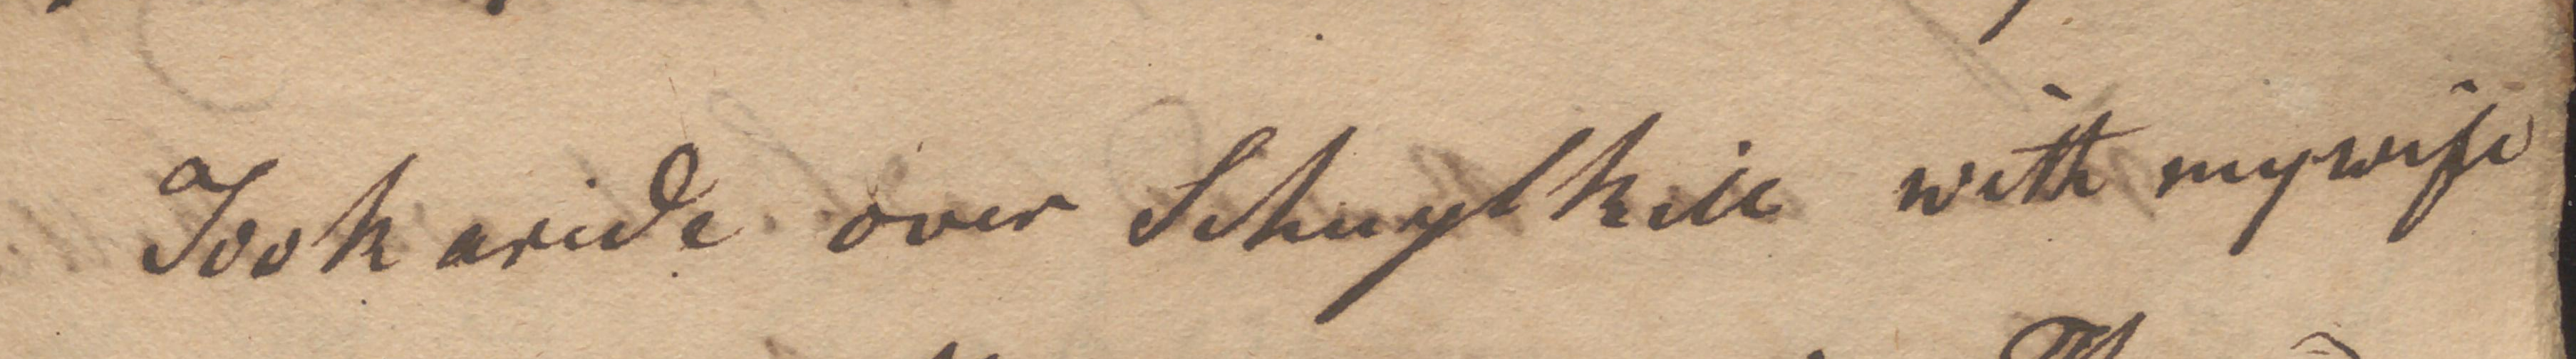Took a ride over Schuylkill with my wife
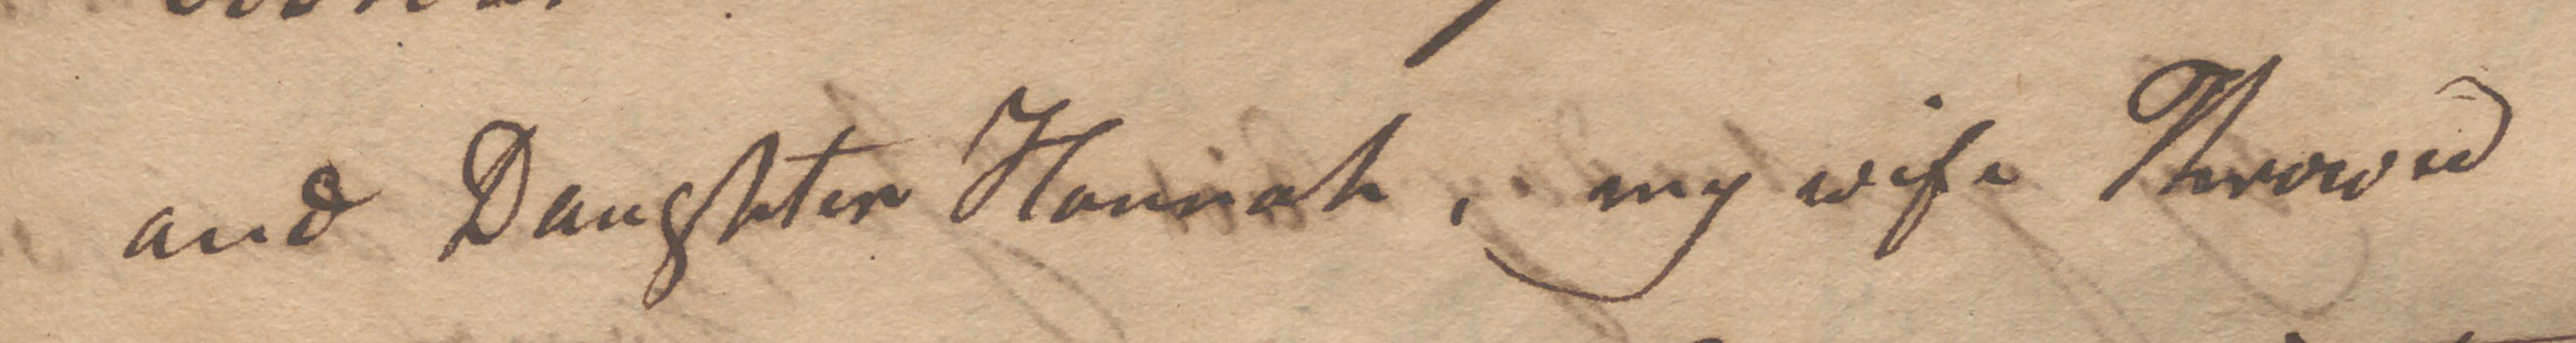and Daughter Hannah, my wife Throwed
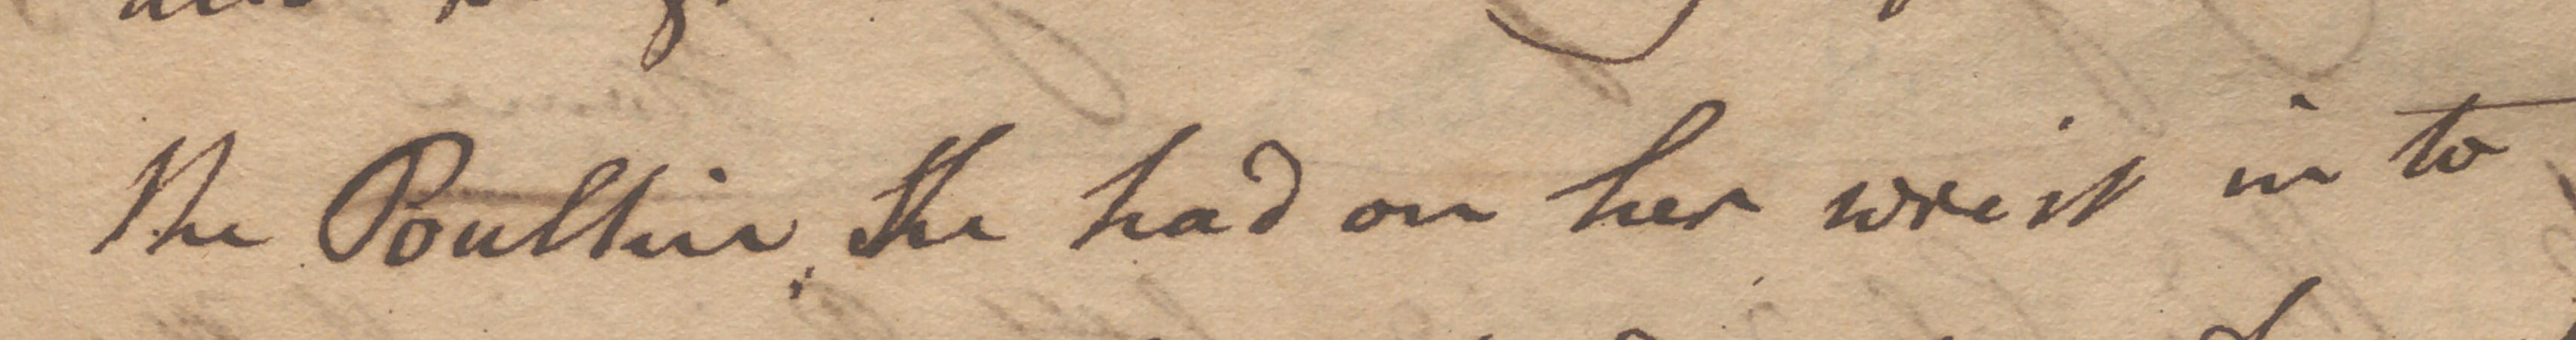the Poultice she had on her wrist in to
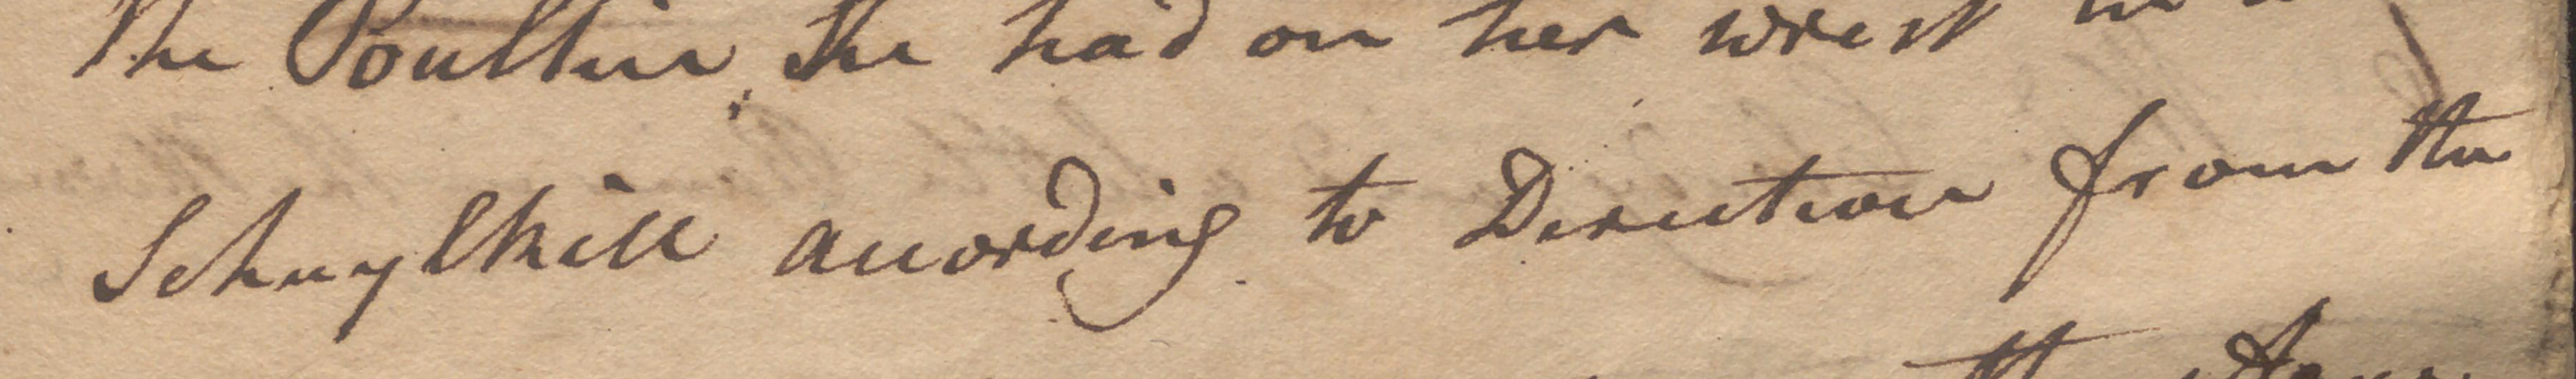Schuylkill according to Direction from the
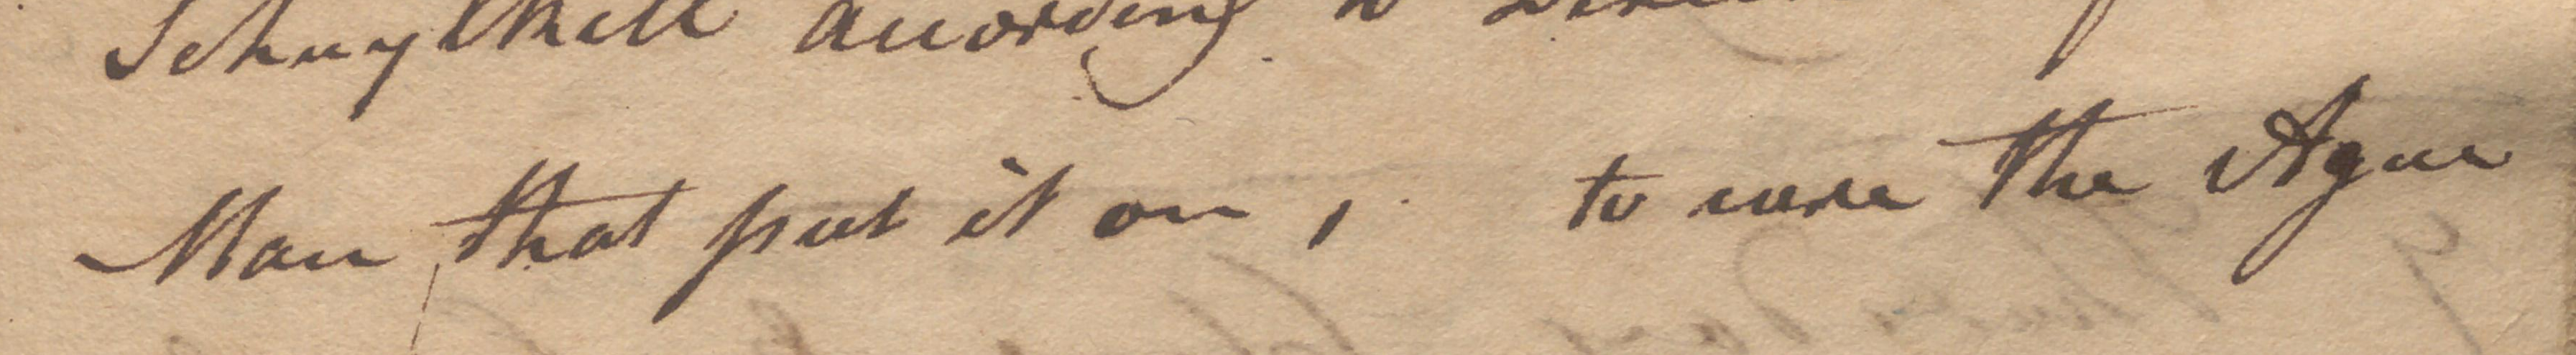Man that put it on, to cure the Ague
